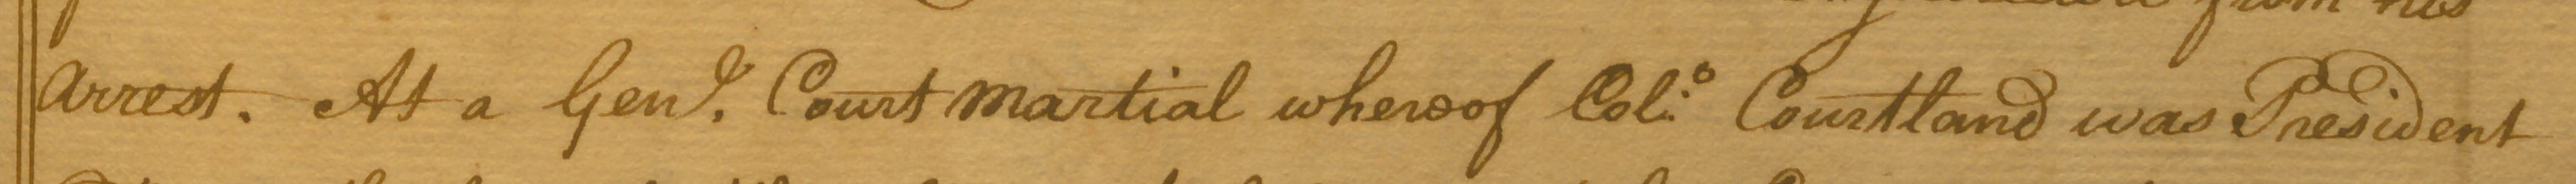Arrest. At a Gen^l. Court martial whereof Col^o. Courtland was President
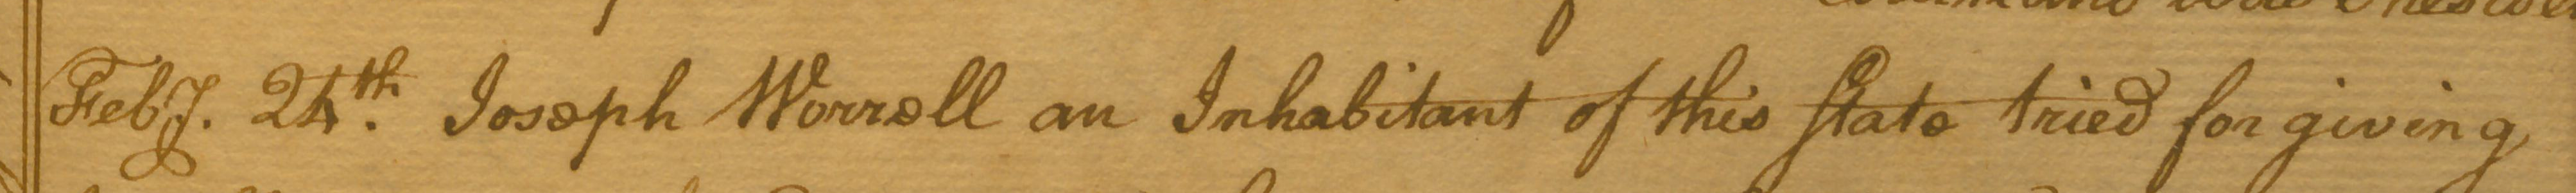Feb^y. 24^th. Joseph Worrell an Inhabitant of this state tried for giving
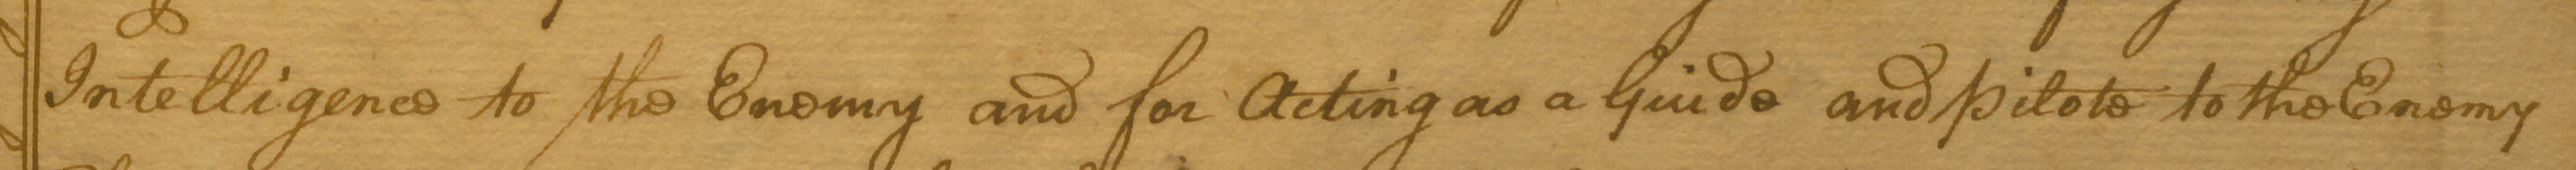Intelligence to the Enemy and for Acting as a Guide and pilote to the Enemy
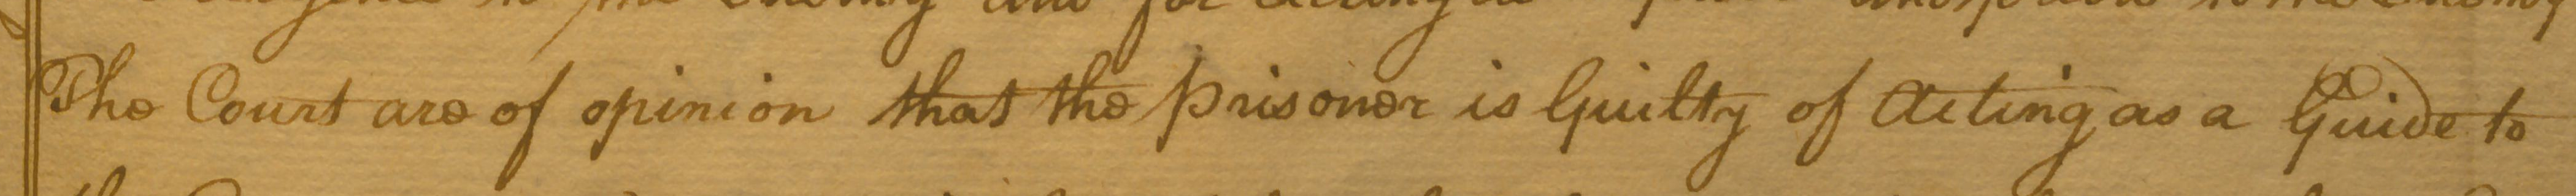The Court are of opinion that the prisoner is Guilty of Acting as a Guide to
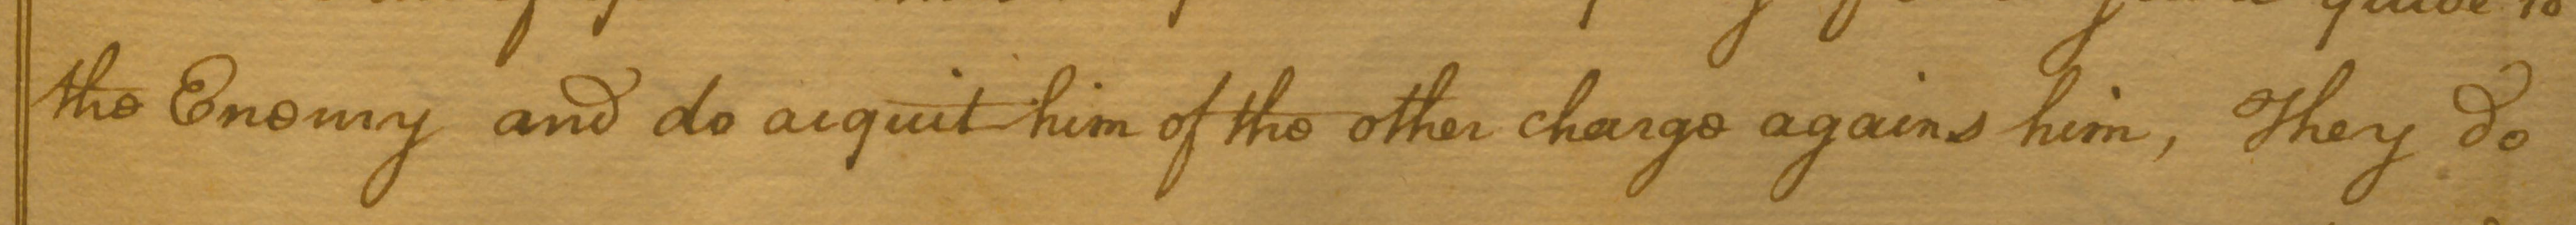the Enemy and do acquit him of other charge agains him, They do
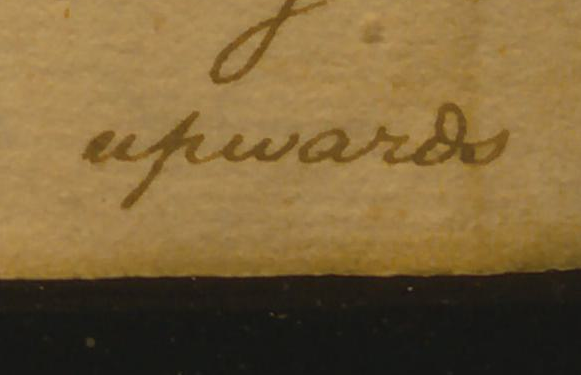upwards
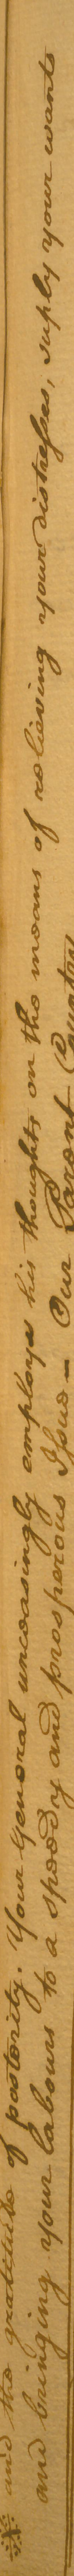* and the gratitude of posterity. Your General unceasingly employs his thoughts on the means of relieving your distress, suply your wants
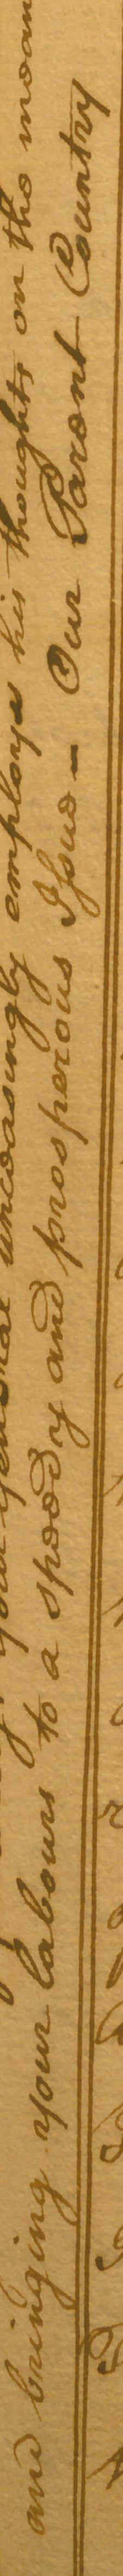and bringing your labours to a speedy and prosperous Issue- Our Parent Country
